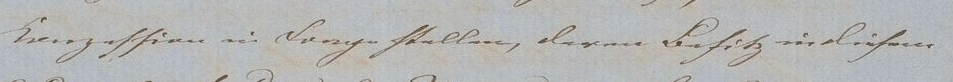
Konzession in Frage stellen, deren Besitz in diesem
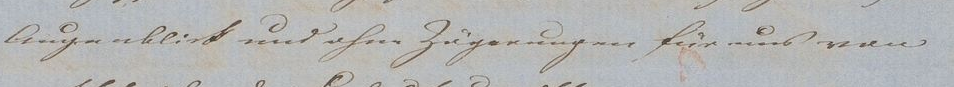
Augenblick und ohne Zögerungen für uns von
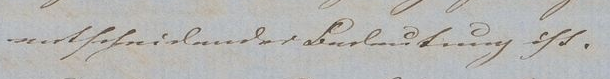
entscheidender Bedeutung ist.
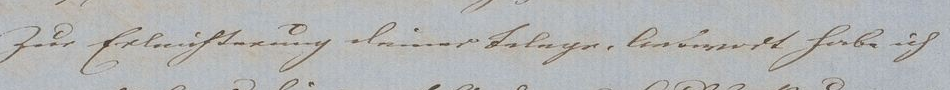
Zur Erleichterung Deiner telegr. Antwort habe ich
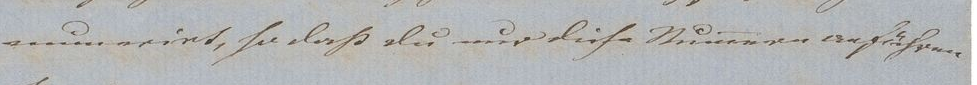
numerirt, so daß du nur diese Nummern anführen
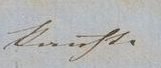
kannst.
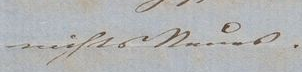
nichts Neues.
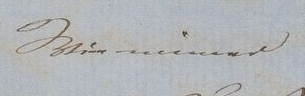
Wie immer
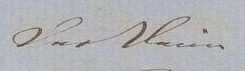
der Deine
